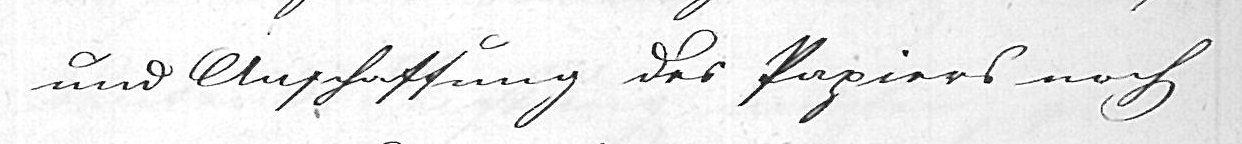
und Anschaffung des Papier noch
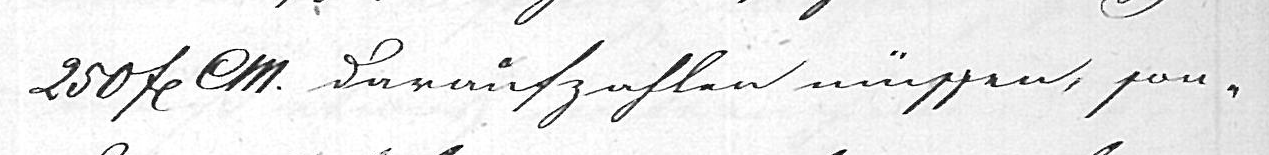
250 fl. CM daraufzahlen müssen, son-
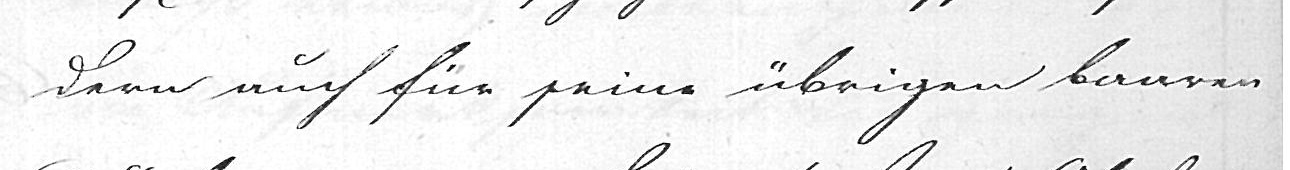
dern auch für seine übrigen baaren
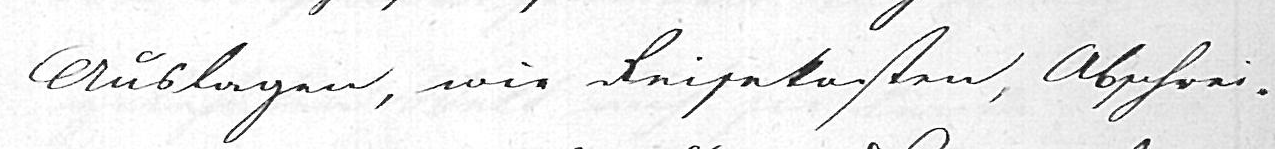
Auslagen, wie Reisekosten, Abschrei-
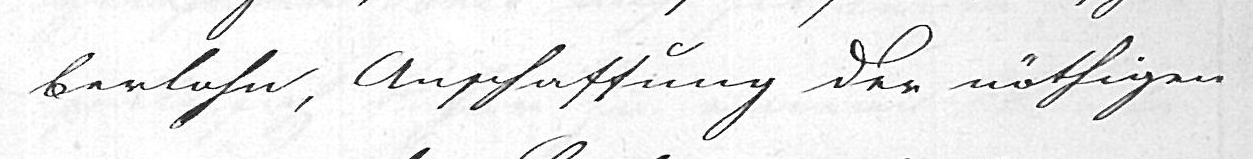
berlohn, Anschaftung der nöthigen
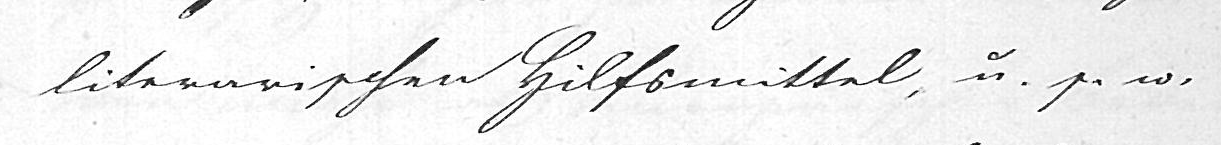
literarischen Hilfsmittel, u. s. w.
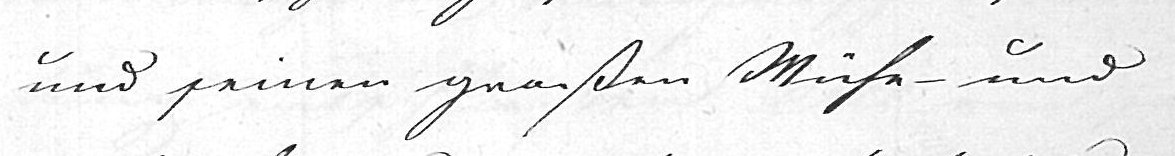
und seinen großen Mühe- und
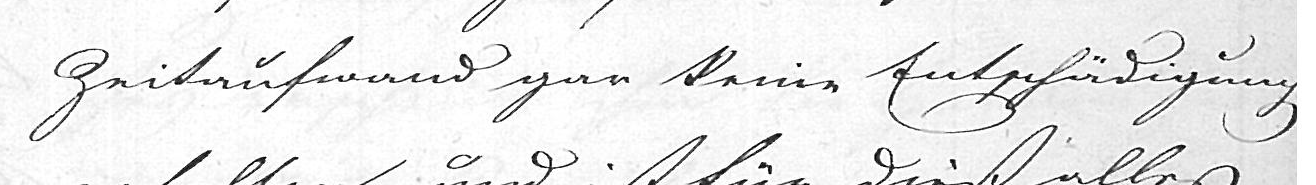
Zeitaufwand gar keine Entschädigung
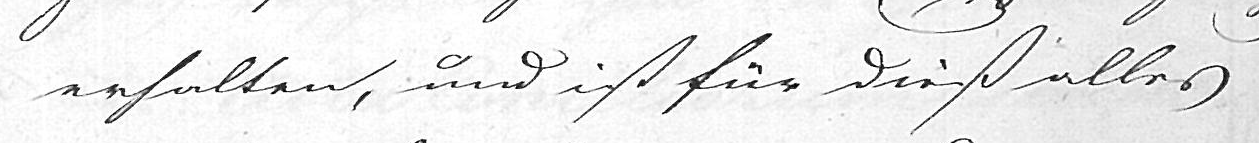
erhalten, und ist für dieß alles
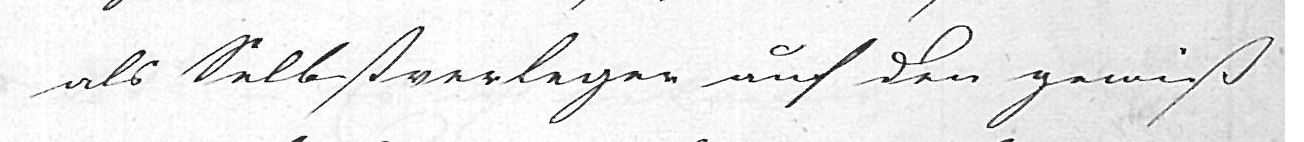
als Selbstverleger auf den gewiß
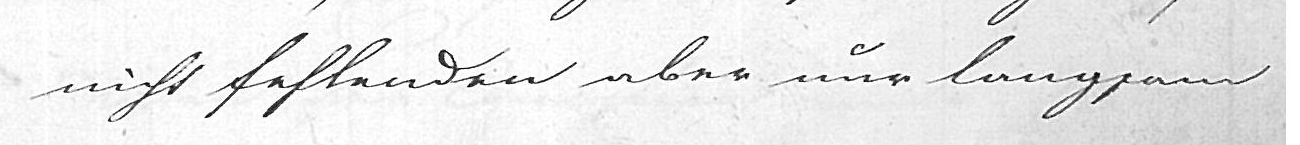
nicht fehlenden, aber nur langsam
